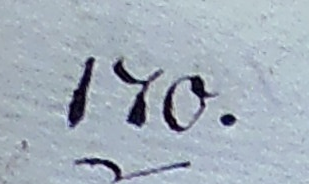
170.
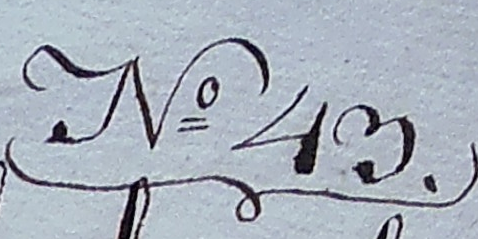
No͇ 43.
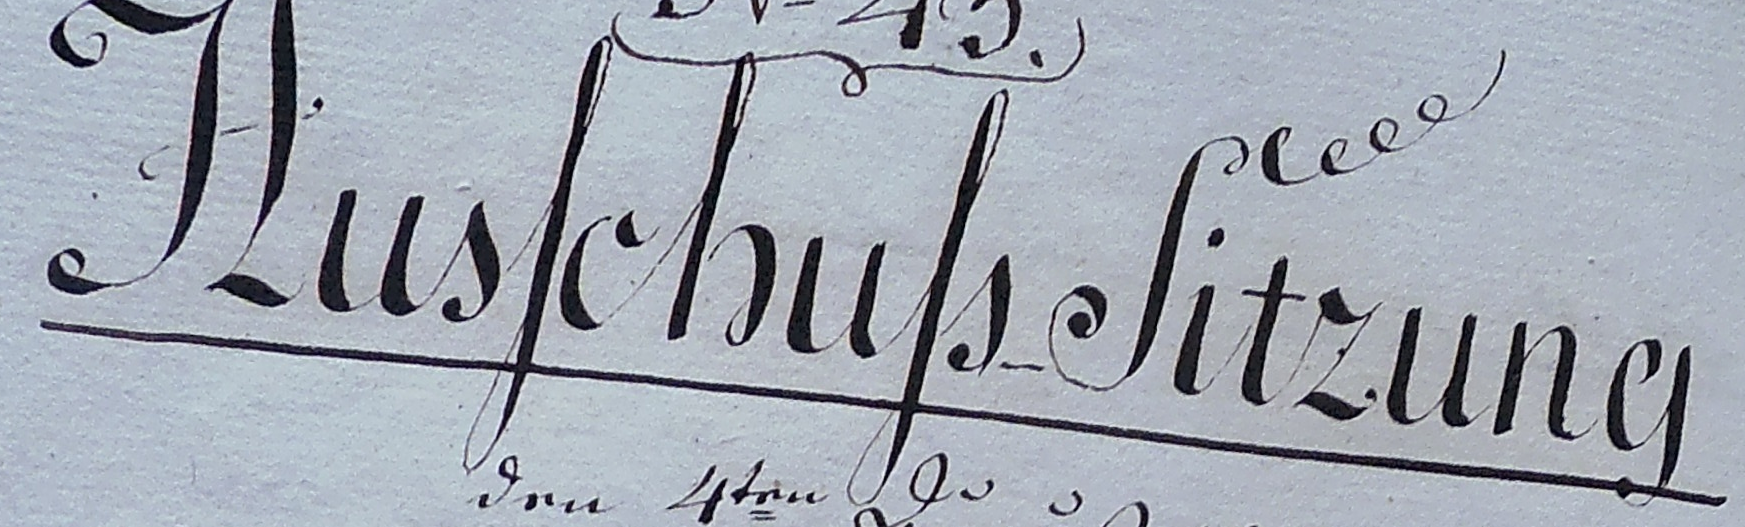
Ausschuss‗Sitzung
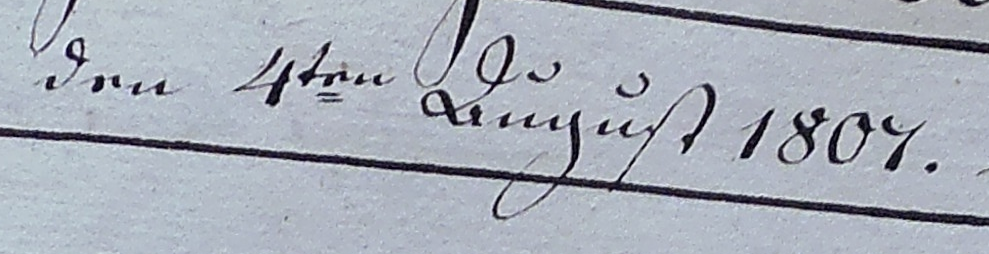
den 4te͇n August 1807.
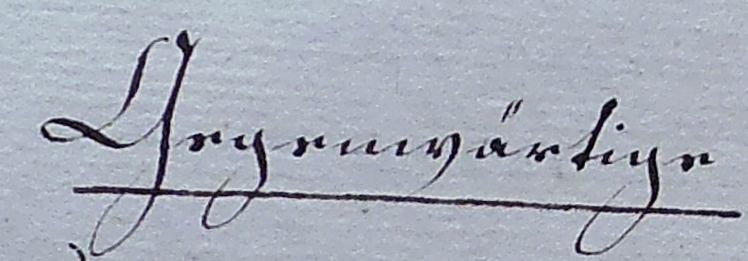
Gegenwärtige
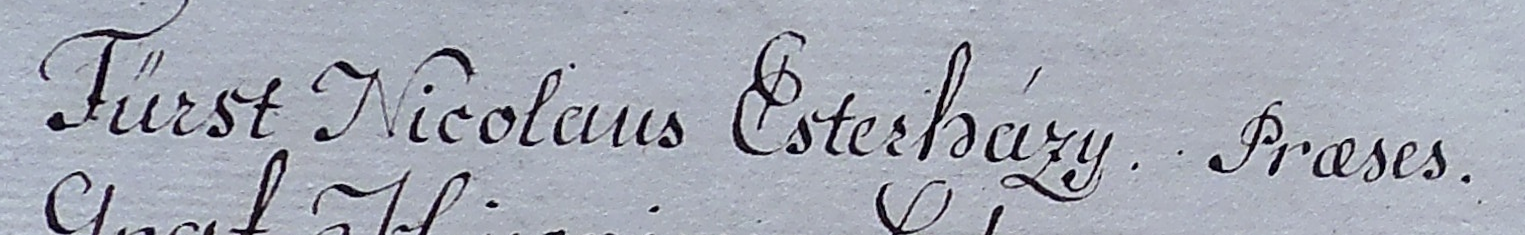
Fürst Nicolaus Esterházy Præses.
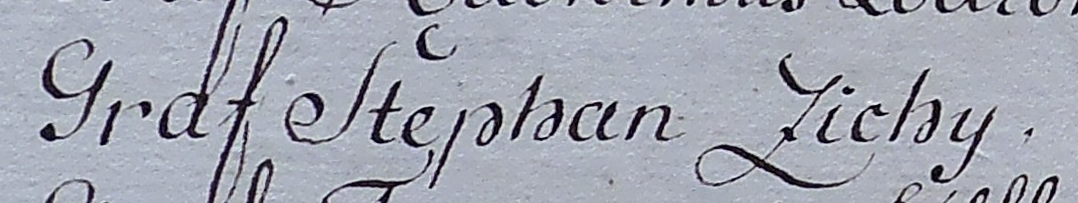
Graf Stephan Zichy.
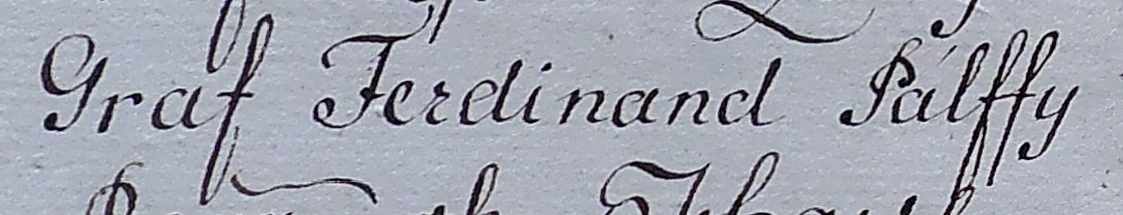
Graf Ferdinand Pálffy
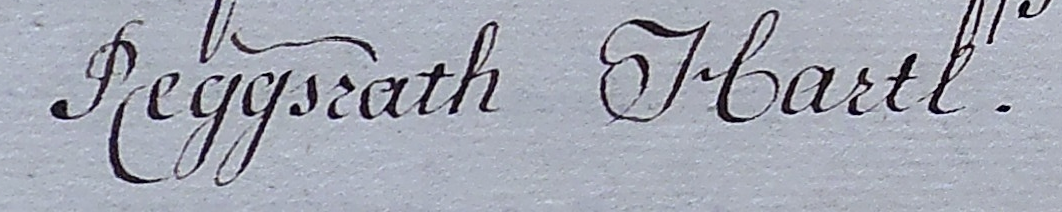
Reg͞gsrath Hartl.
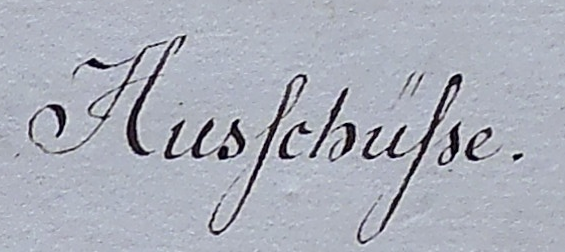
Ausschüsse.
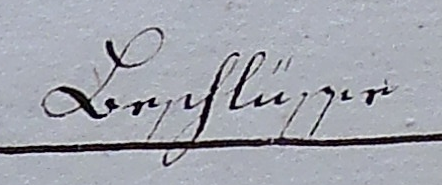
Beschlüsse
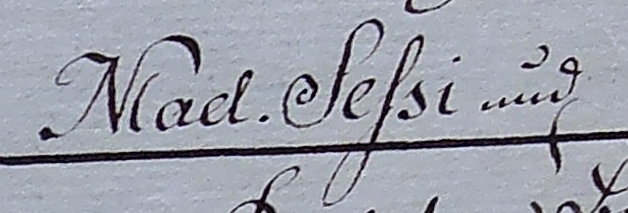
Mad. Sessi und
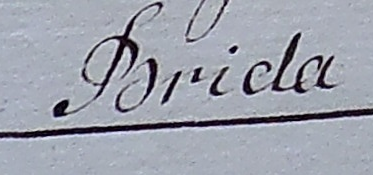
Brida
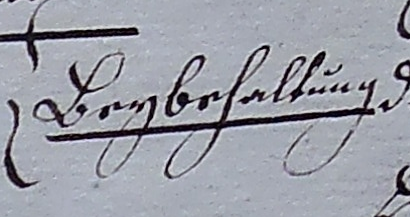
Beybehaltung
